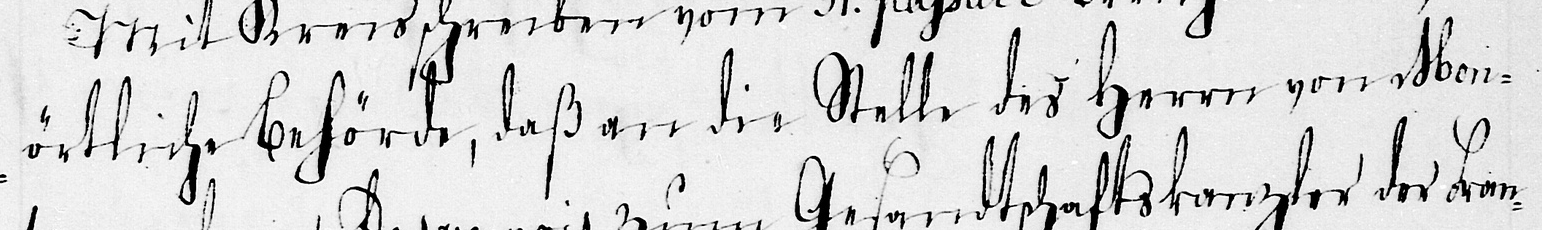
örtliche Behörde, daß an die Stelle des Herrn von Mon¬
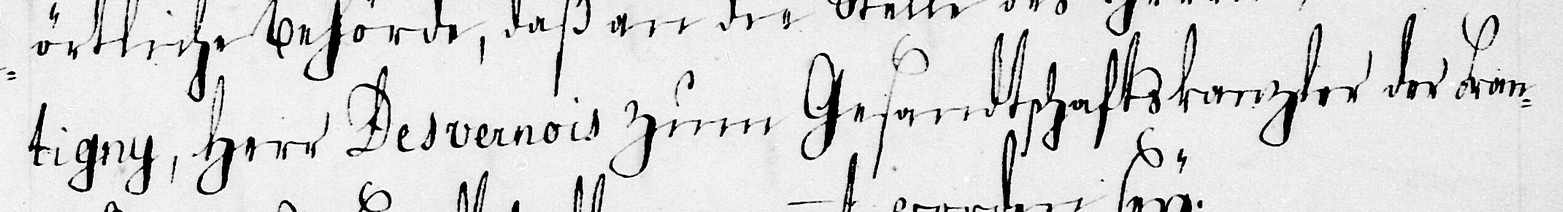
tigny, Herr Desvernois zum Gesandtschaftskanzler der Fran¬
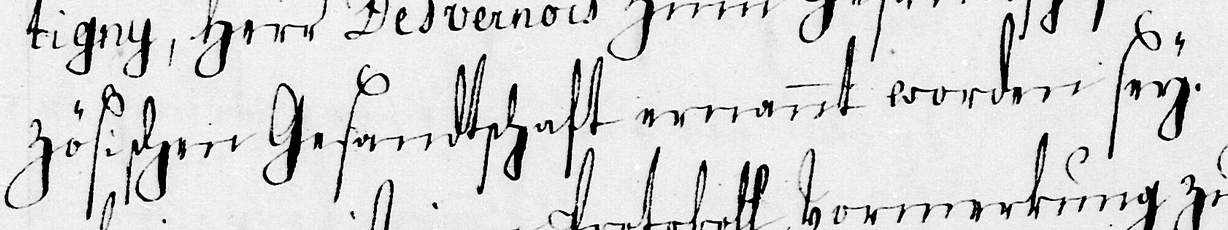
zösischen Gesandtschaft ernannt worden sey.
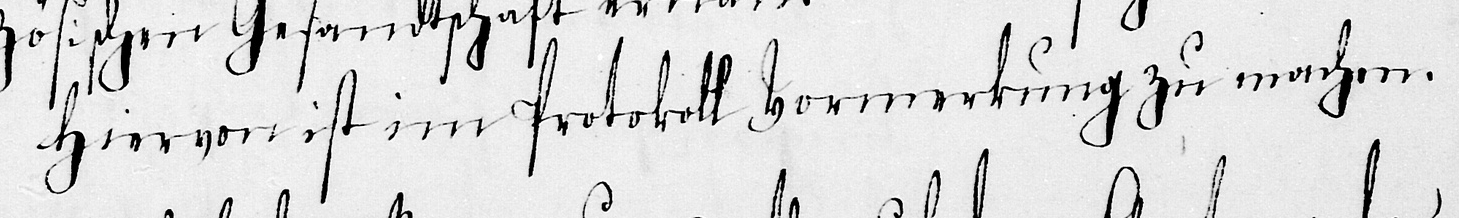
Hiervon ist im Protokoll Vormerkung zu machen.
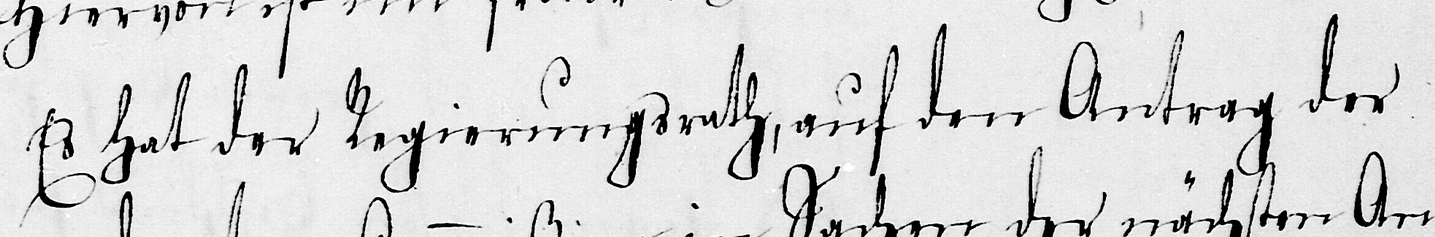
Es hat der Regierungsrath, auf den Antrag der
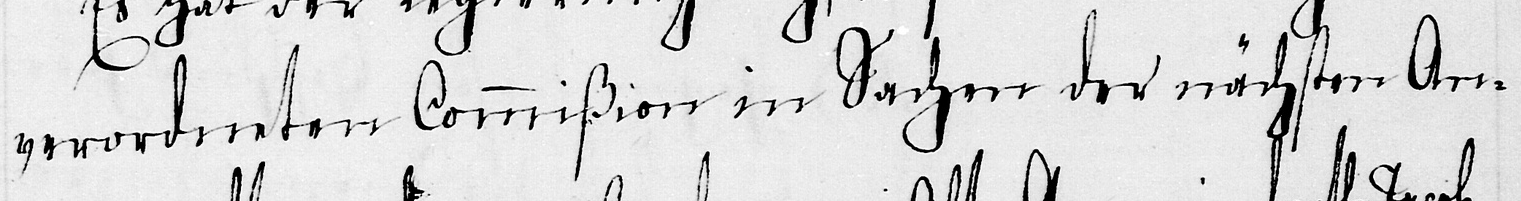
verordneten Commißion in Sachen der nächsten An¬
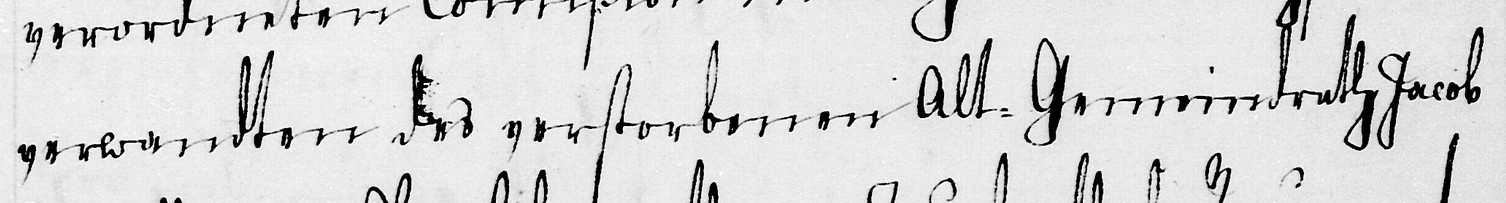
verwandten des verstorbenen Alt-Gemeindrath Jacob
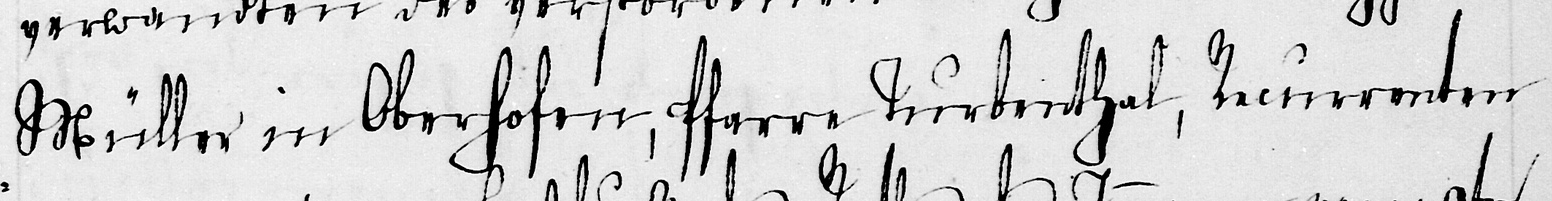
Müller in Oberhofen, Pfarre Turbenthal, Recurrenten
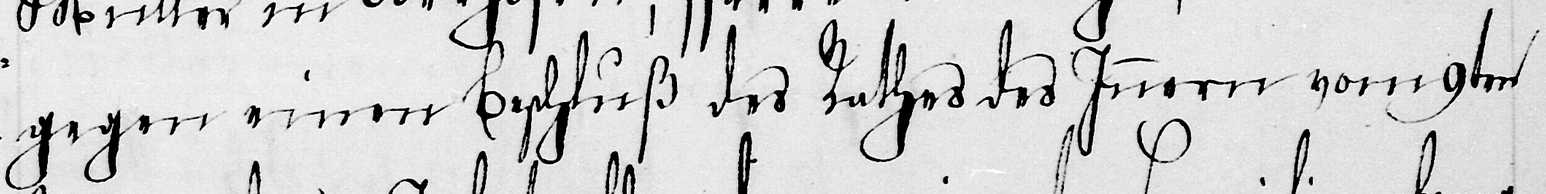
gegen einen Beschluß des Rathes des Innern vom 9ten
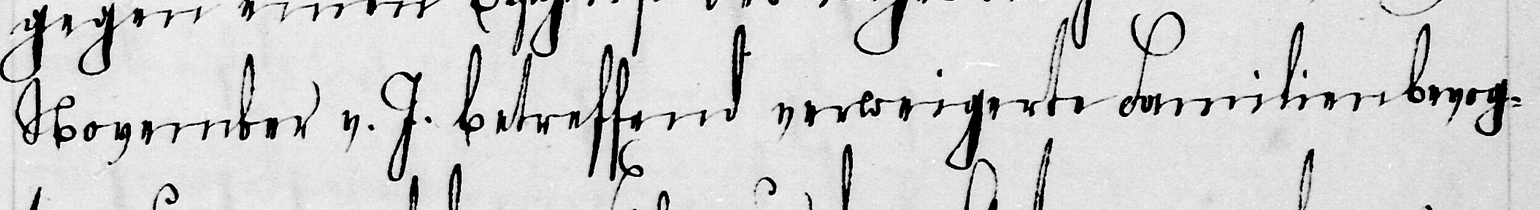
November v. J. betreffend verweigerte Familienbevog¬
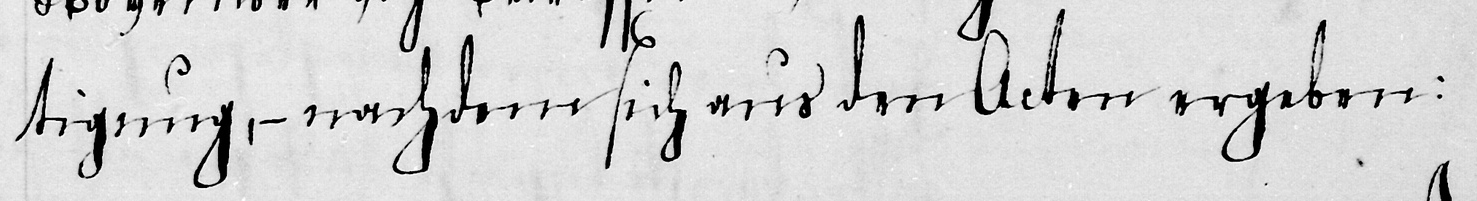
tigung, – nachdem sich aus den Acten ergeben:
